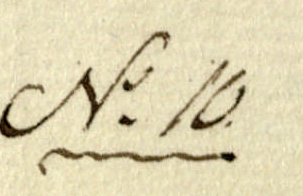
Nº 10.
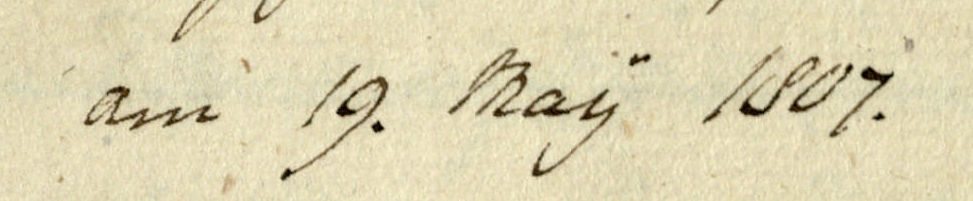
am 19. Maÿ 1807.
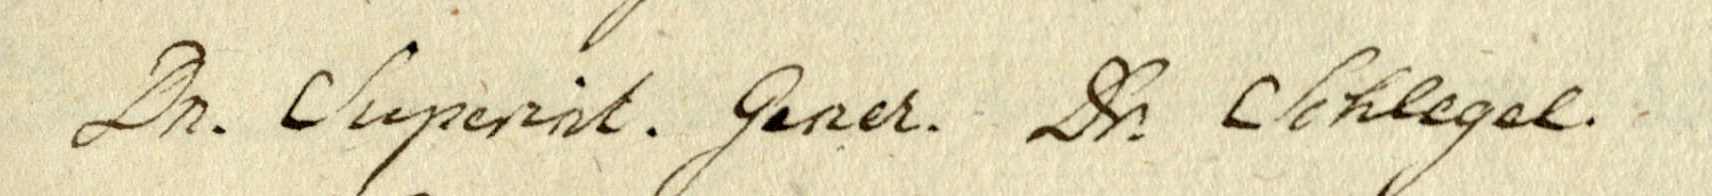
Dn. Superint. Gener. Dr. Schlegel.
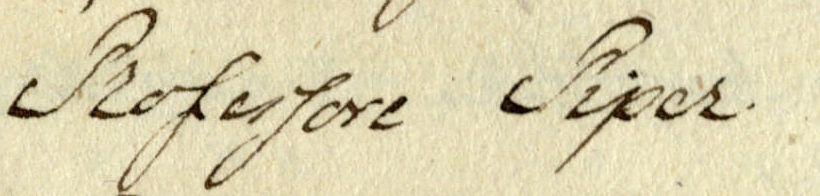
Professore Piper.
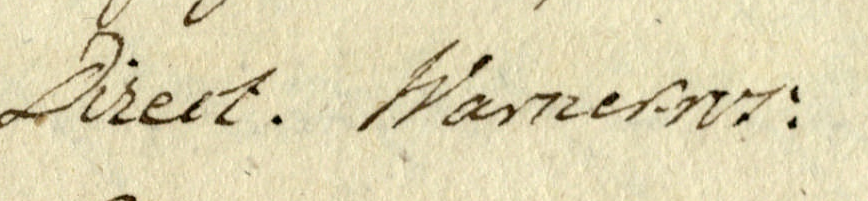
Direct. Warnekros.
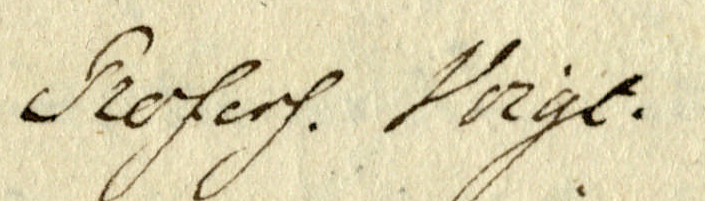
Profess. Voigt.
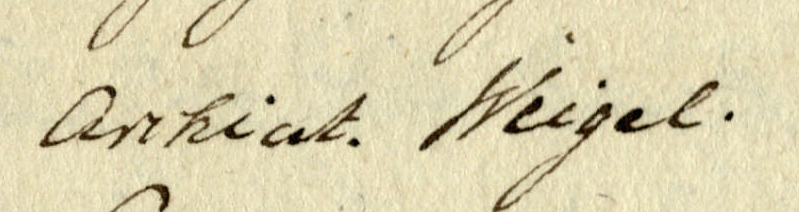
Archiat. Weigel
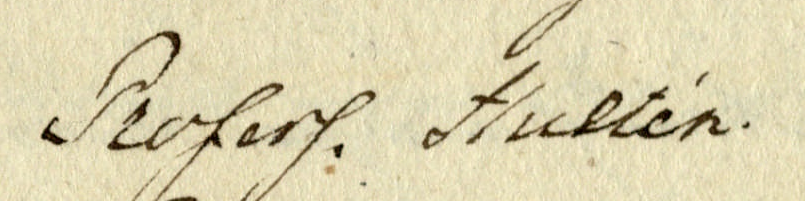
Profess. Hultén.
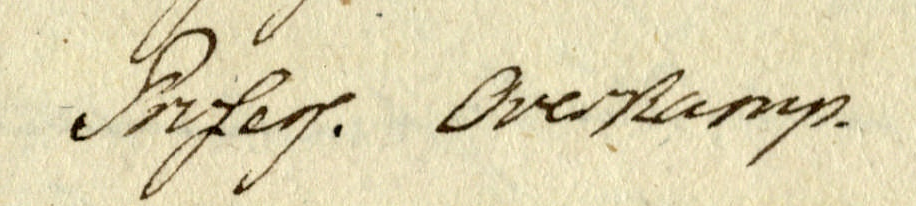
Profess. Overkamp.
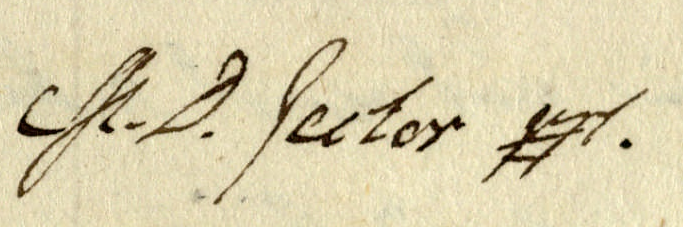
M. D. Rector ppt.
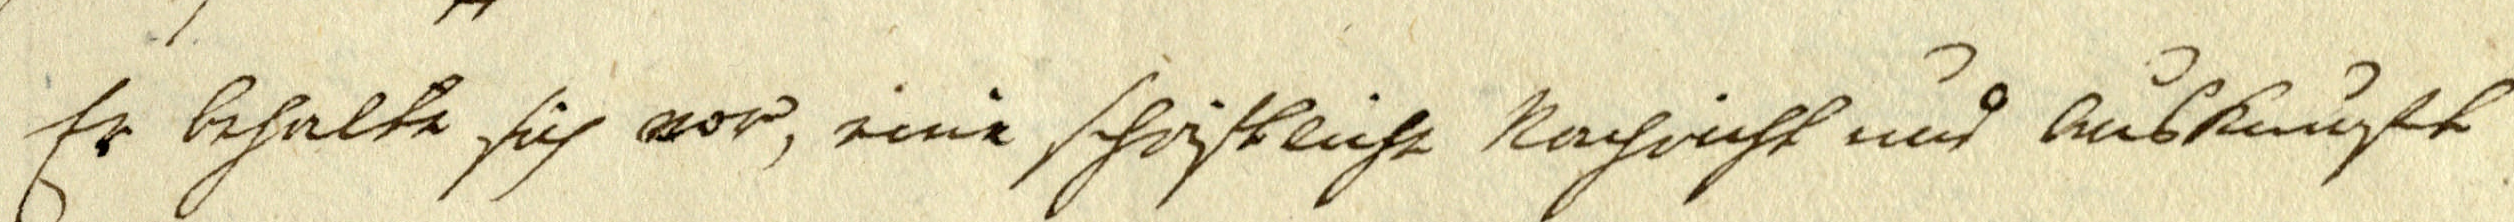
Er behalte sich vor, eine schriftliche Nachricht und Auskunft
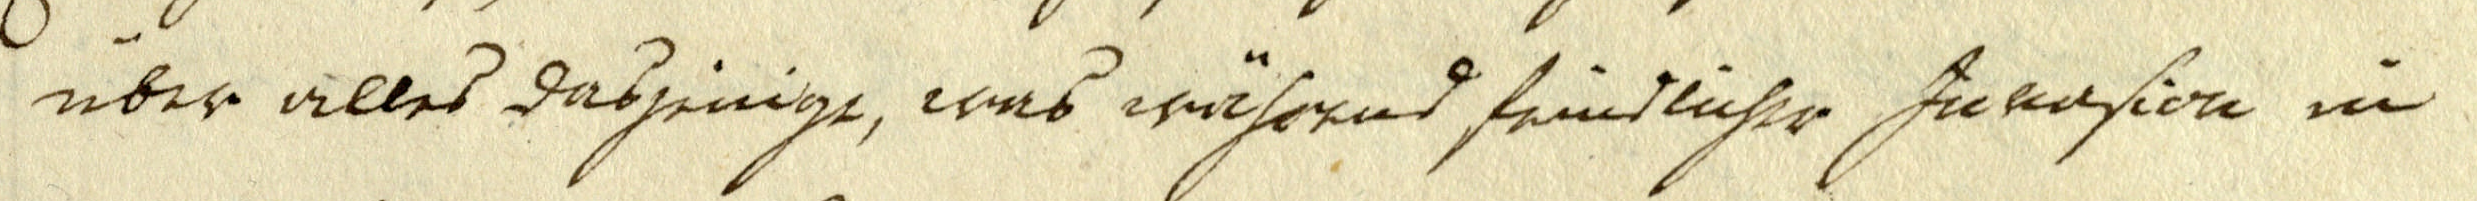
über alles dasjenige, was während feindlicher Invasion in
